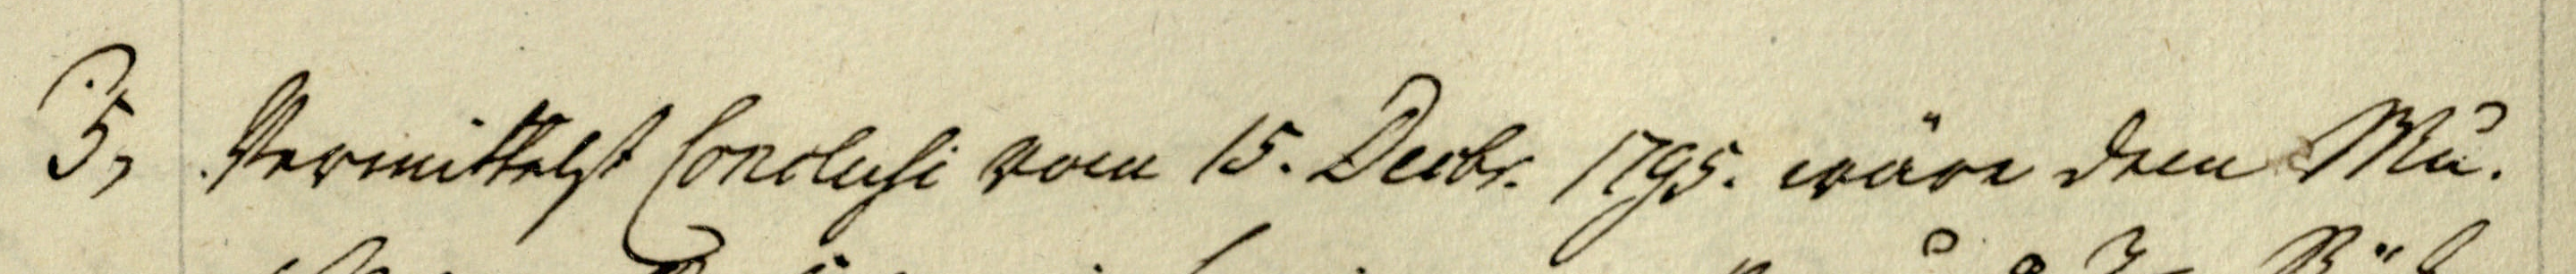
5., Vermittelst Conclusi vom 15. Decbr. 1795. wäre dem Mu¬
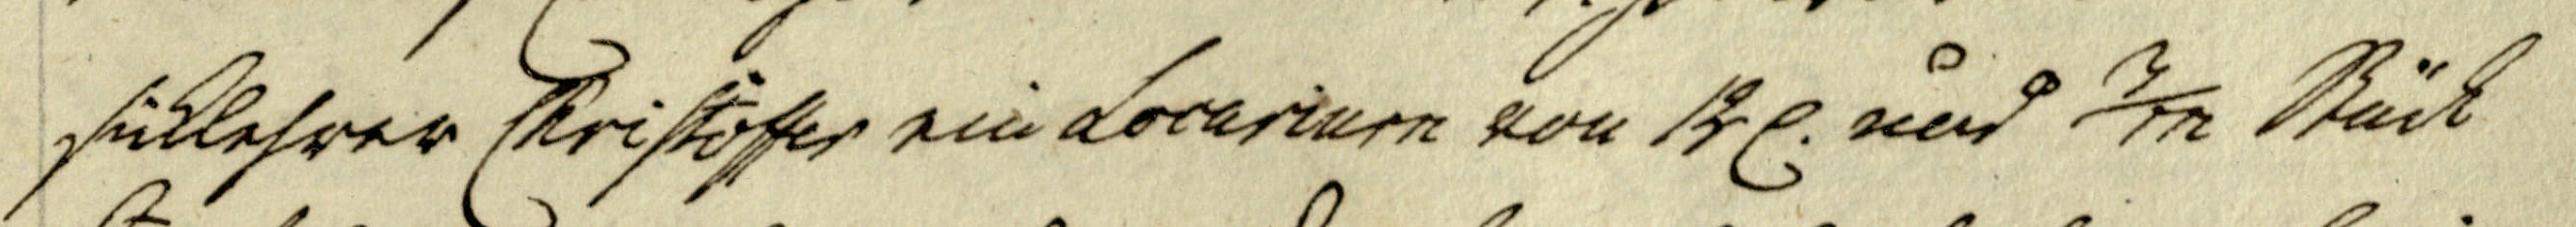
sicklehrer Christoffer ein Locarium von 12 l. und 3/m Stück
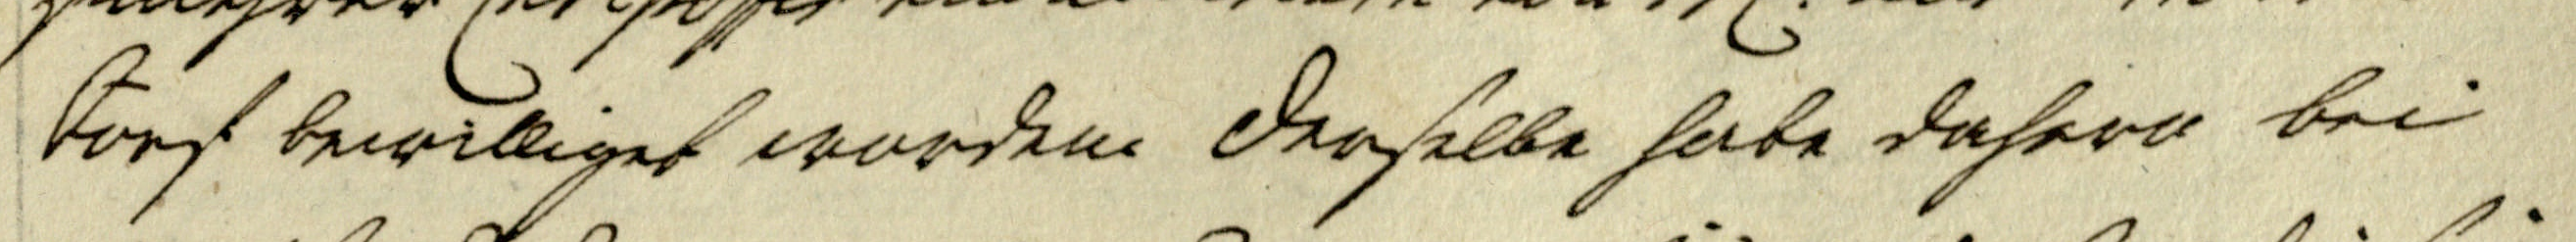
Torf bewilliget worden. Derselbe habe daher bei
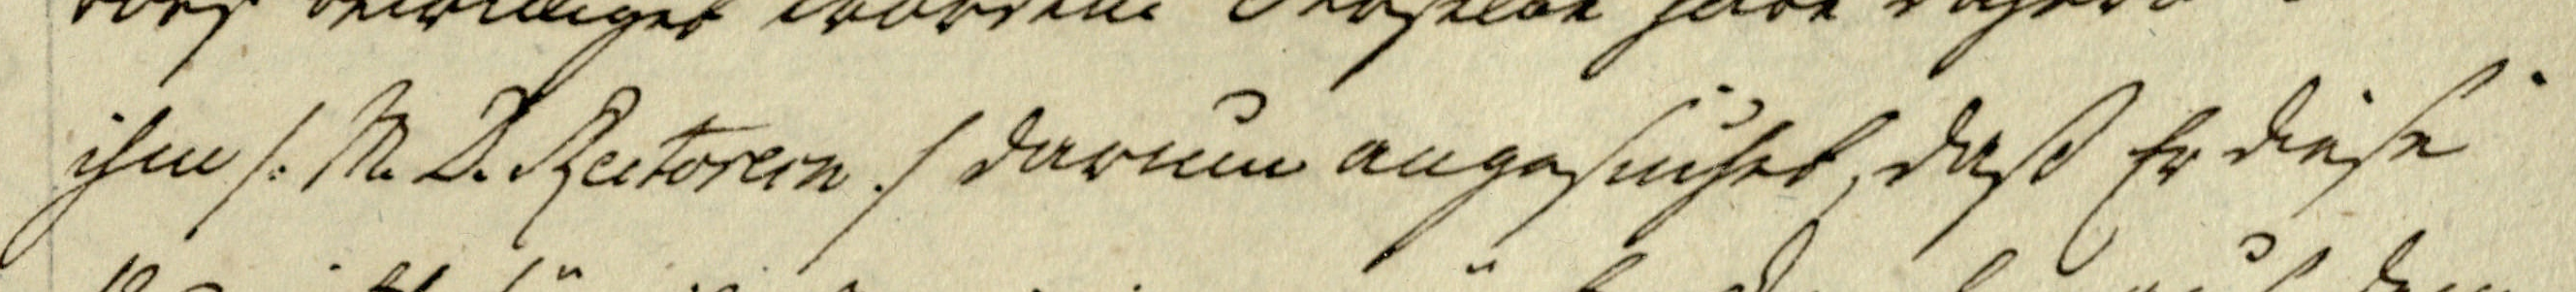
ihm /. M. D. Rectorem ./ darum angesuchet, daß Er diese
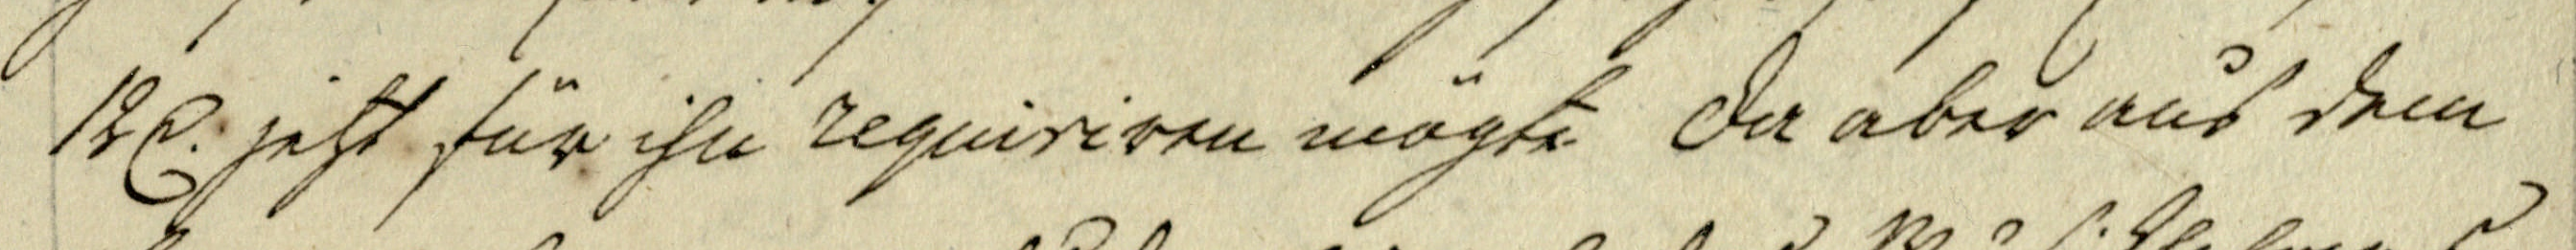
12 l. jetzt für ihn requiriren mögte. Da aber aus dem
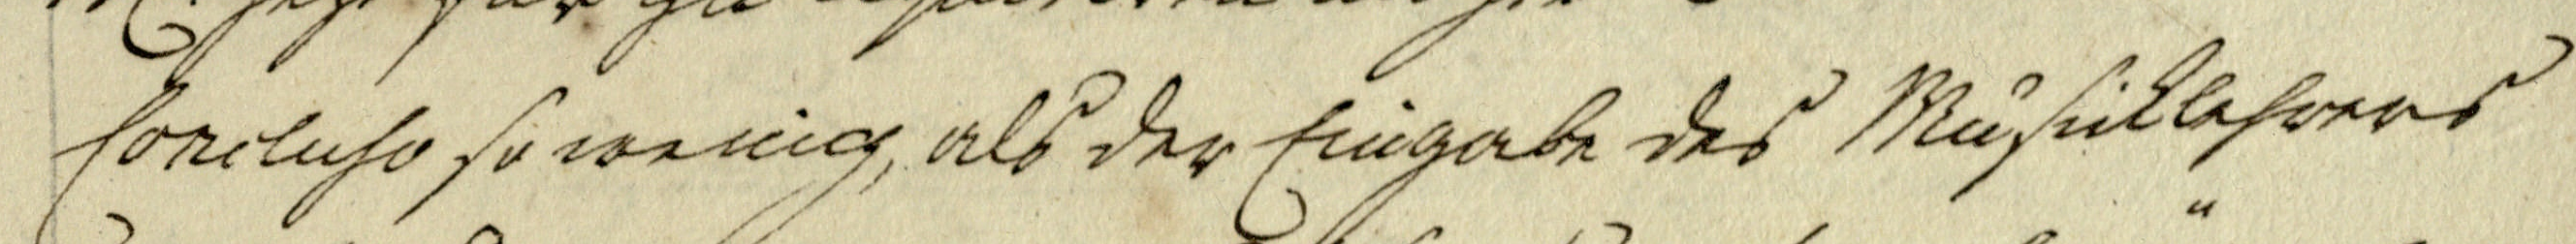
Concluso so wenig, als der Eingabe des Musicklehrers
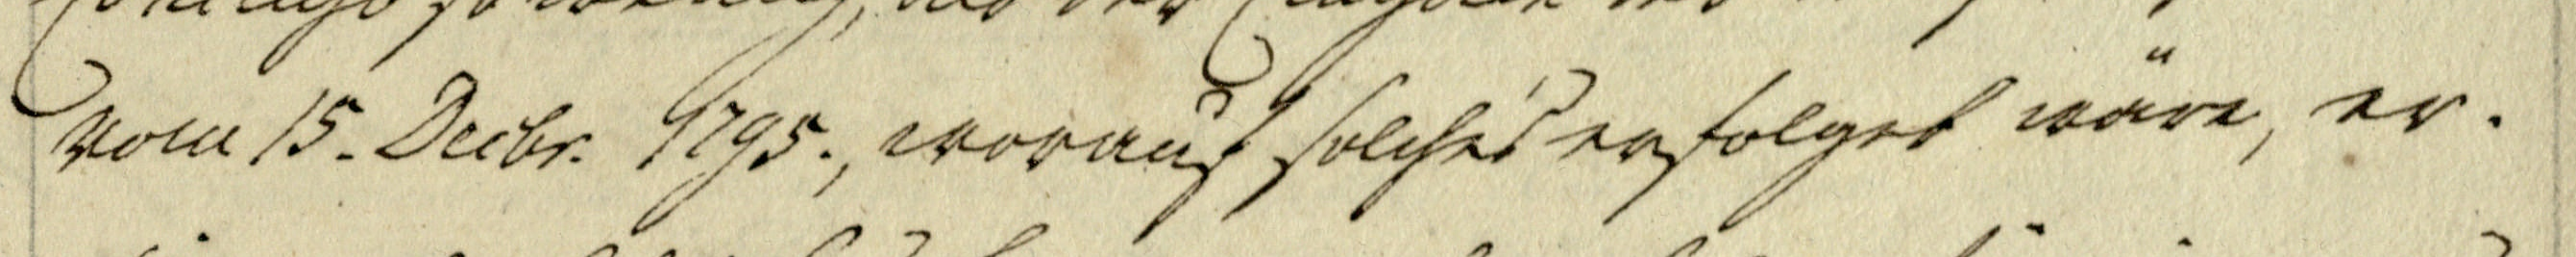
vom 15. Decbr. 1795., worauf solches erfolget wäre, er¬
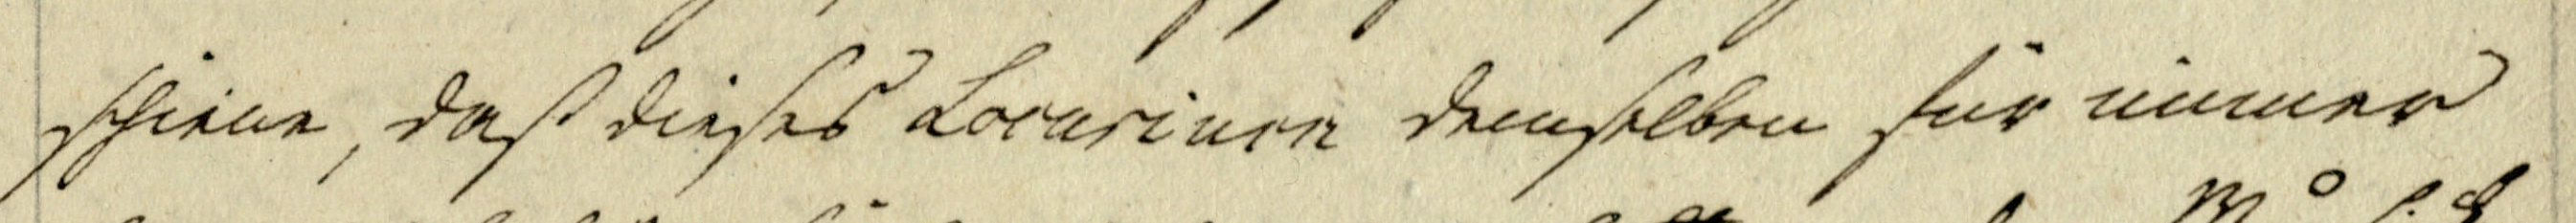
schiene, daß dieses Locarium demselben für immer
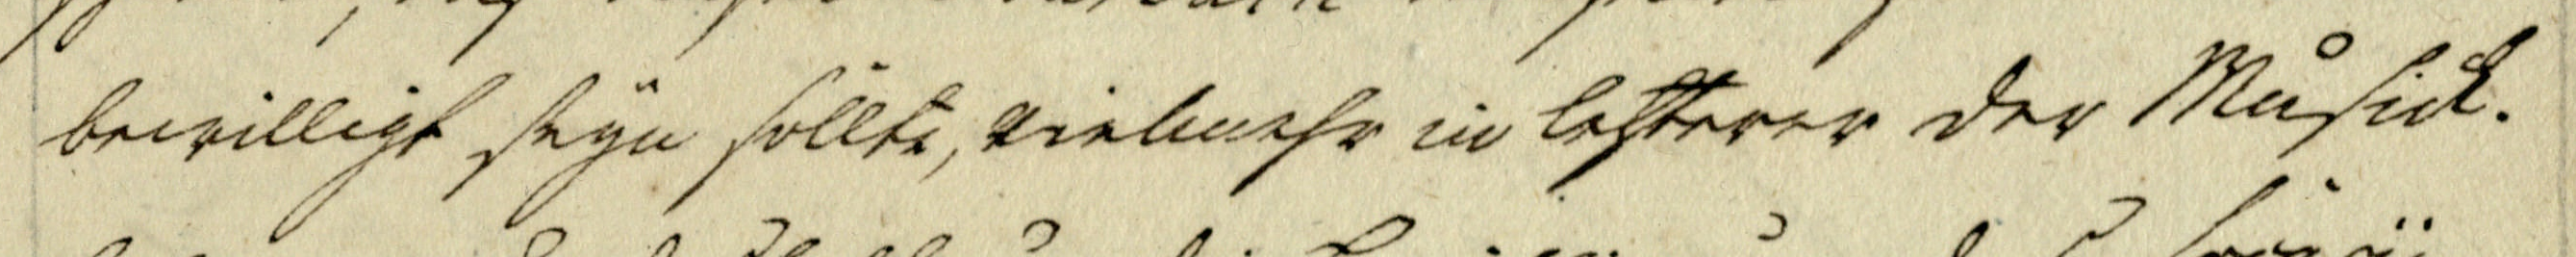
bewilligt seÿn sollte, vielmehr in letzterer der Musick¬
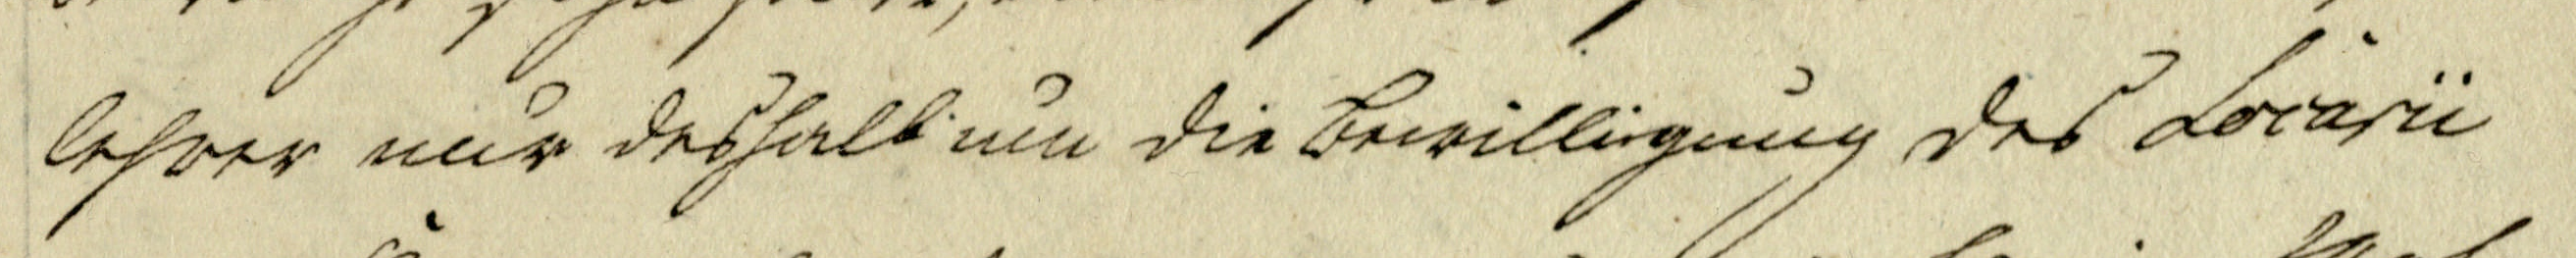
lehrer nur deshalb um die Bewilligung des Locarii
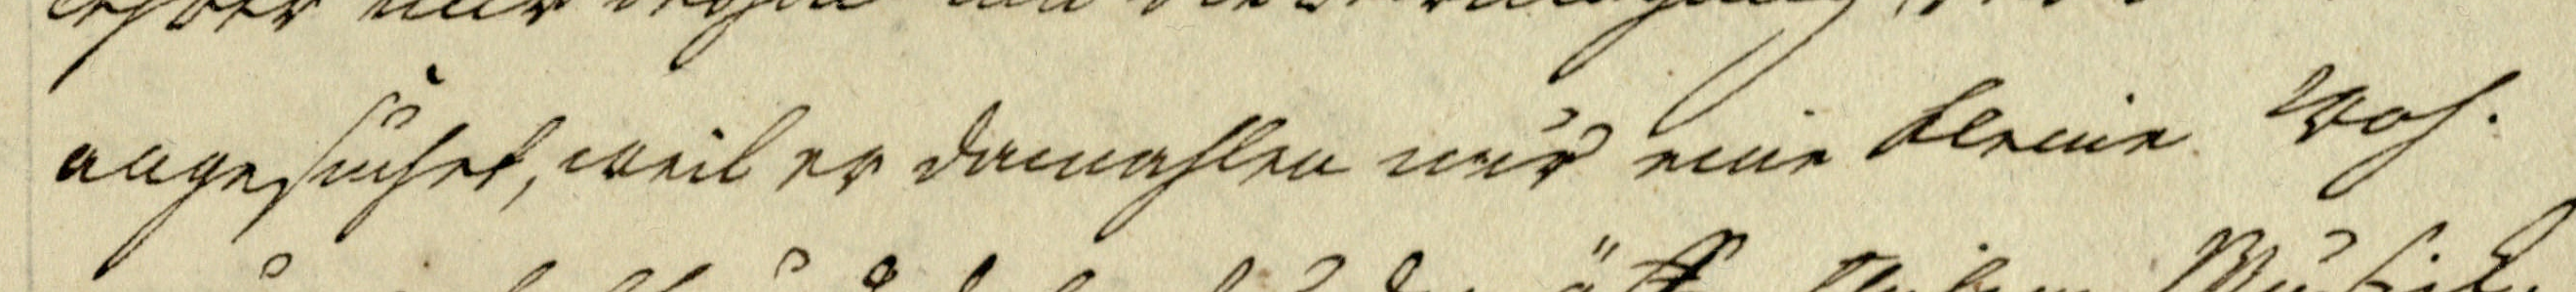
angesuchet, weil er damahlen nur eine kleine Woh¬
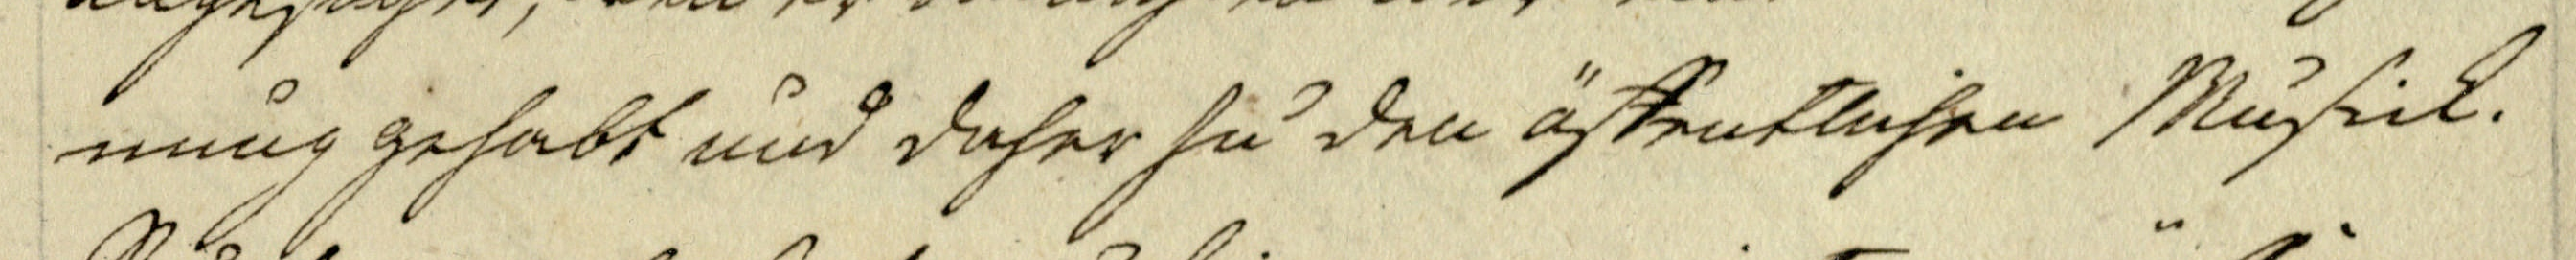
nung gehabt und daher zu den öffentlichen Musick¬
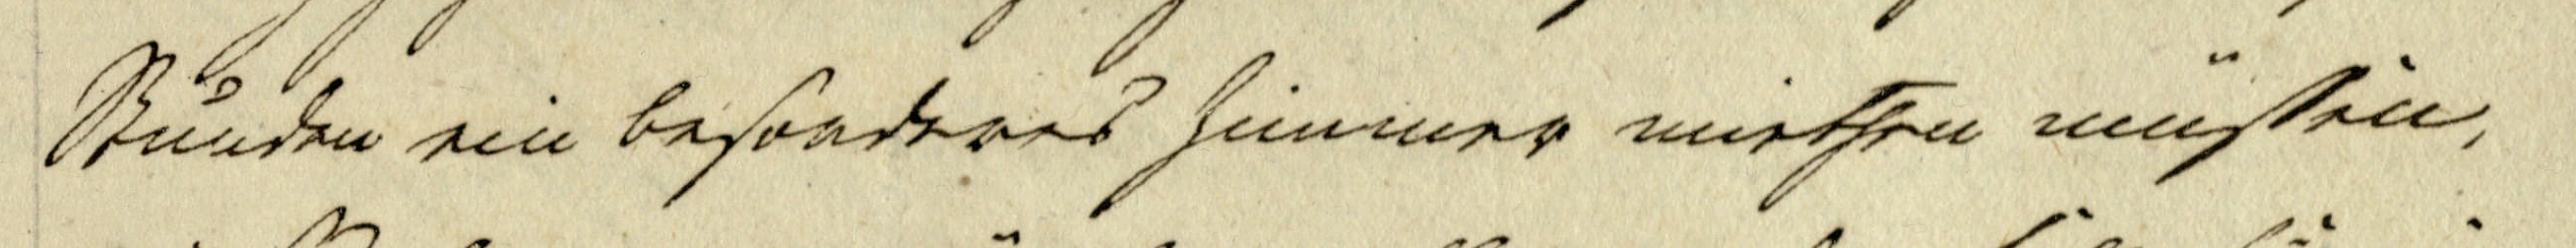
Stunden ein besonderes Zimmer miethen müssen,
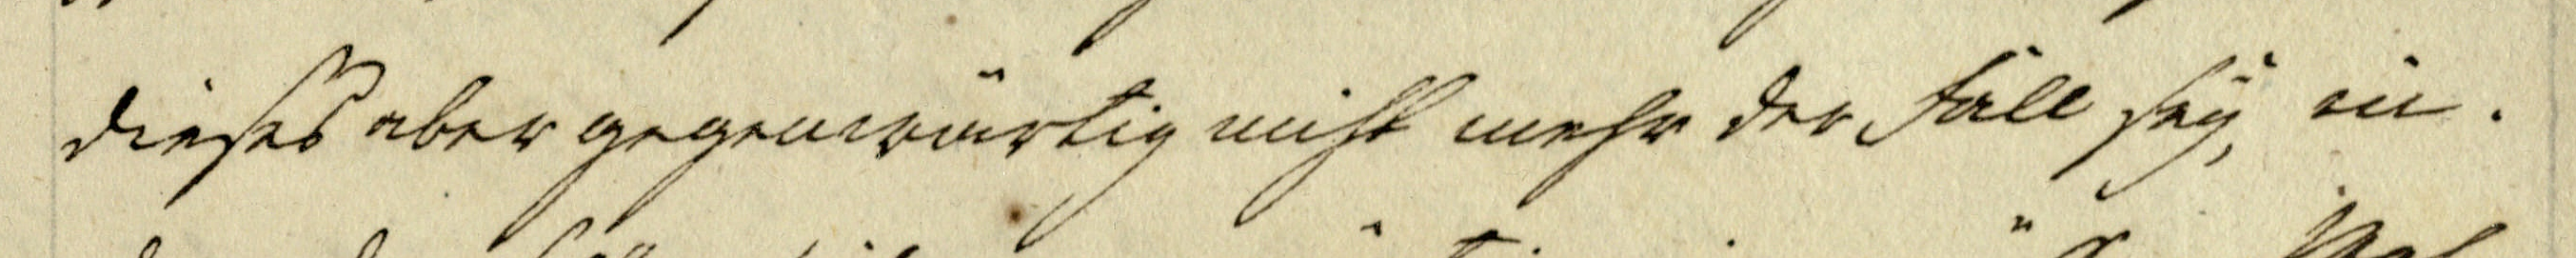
dieses aber gegenwärtig nicht mehr der Fall seÿ, in¬
